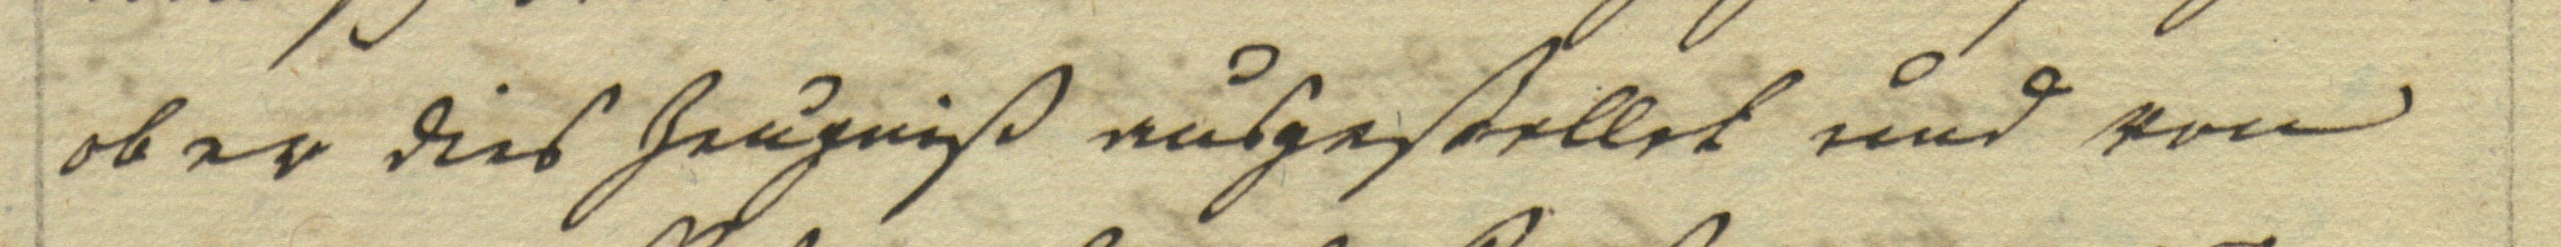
ob er dies Zeugniß ausgestellet und von
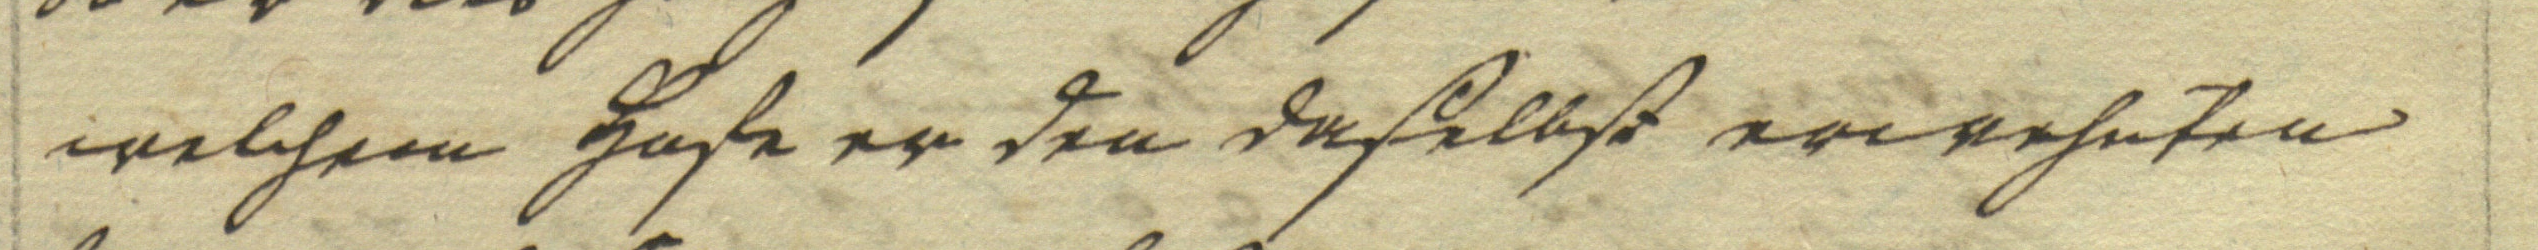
welchem Hofe er den daselbst erwehnten
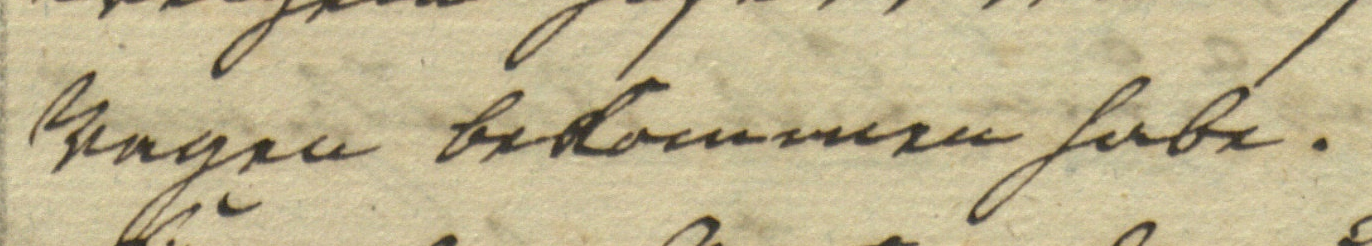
Wagen bekommen habe.
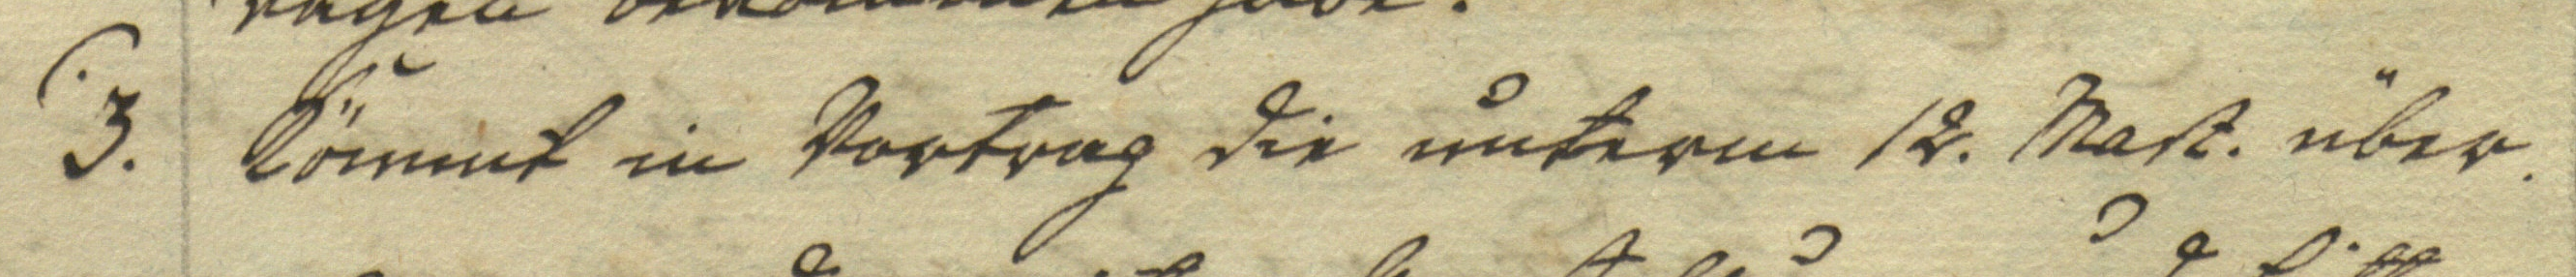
3. Kömmt in Vortrag die unterm 12. Mart. über¬
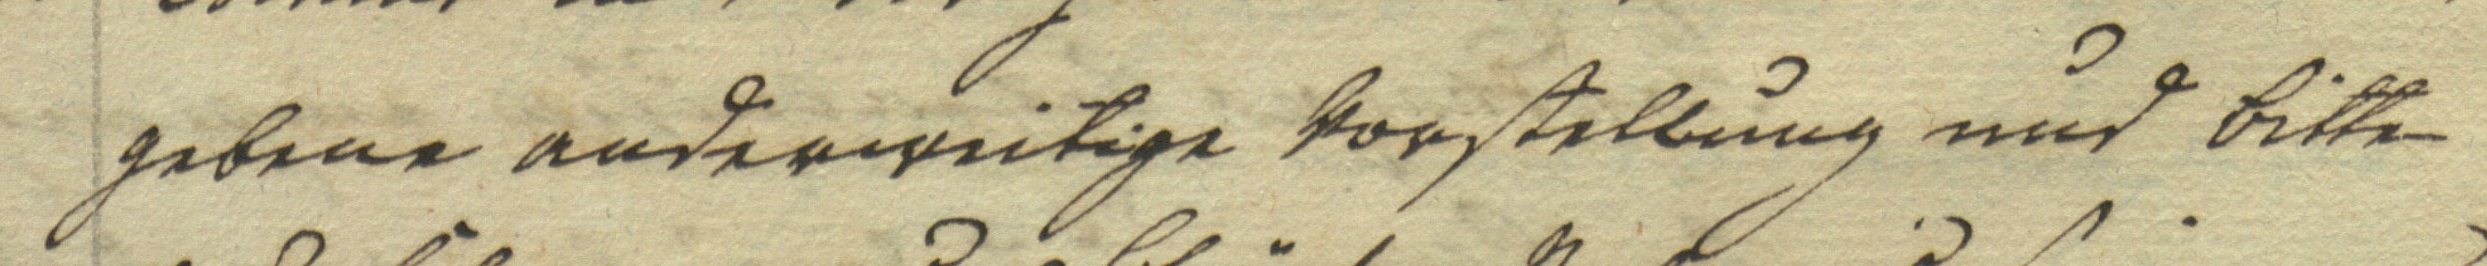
gebene anderweitige Vorstellung und Bitte
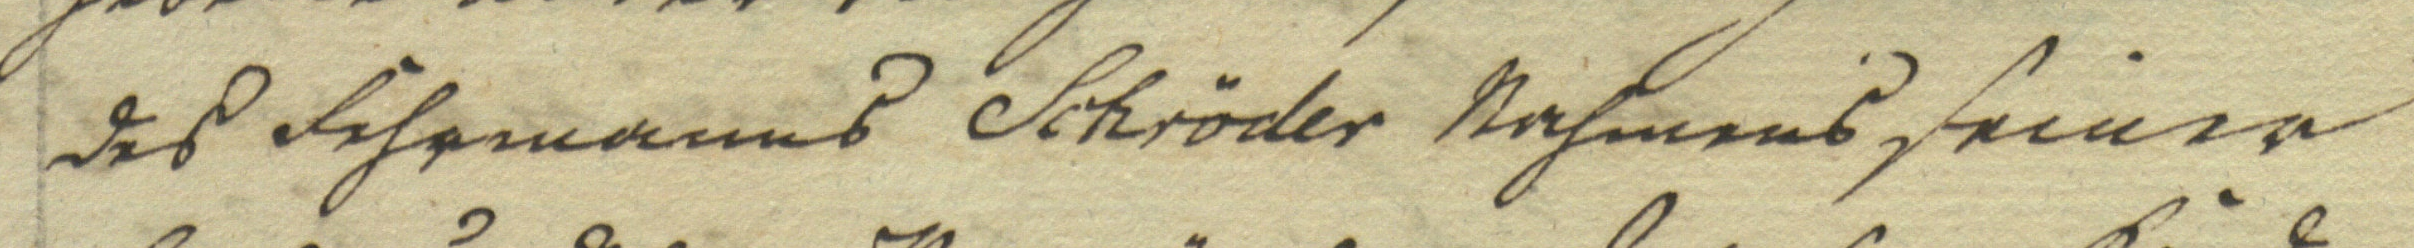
des Fehrmanns Schröder Nahmens seiner
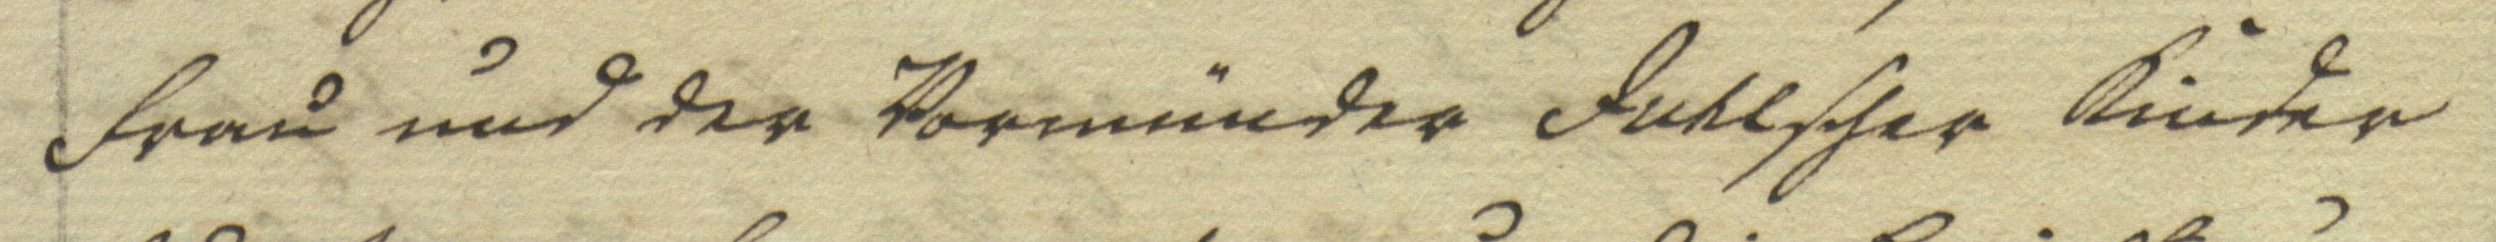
Frau und der Vormünder Juhlscher Kinder
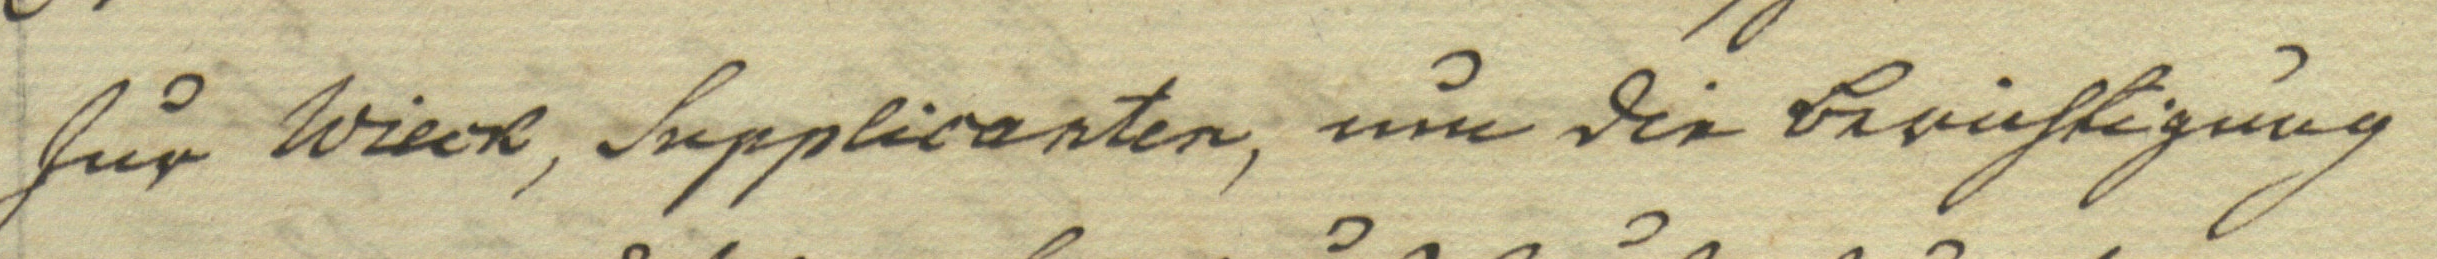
zur Wieck, Supplicanten, um die Berichtigung
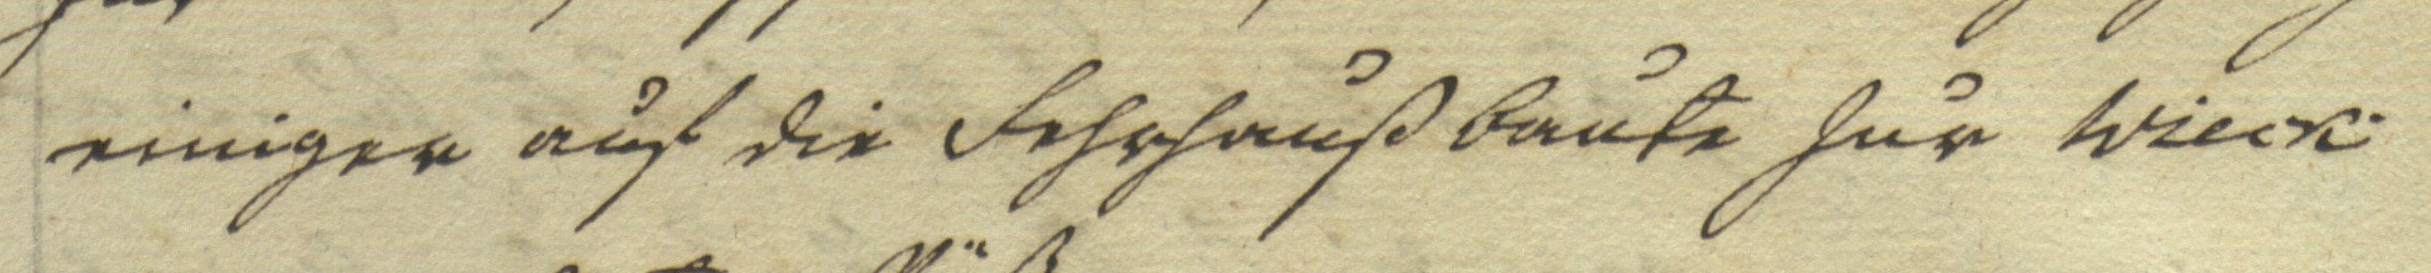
einiger auf die Fehrhaußbaute zur Wieck
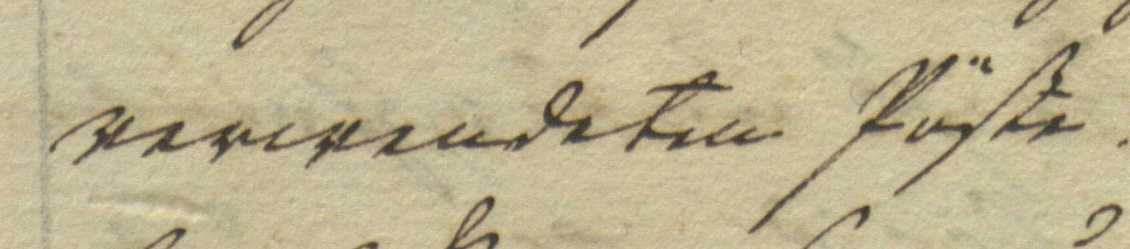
verwendeten Pöste.
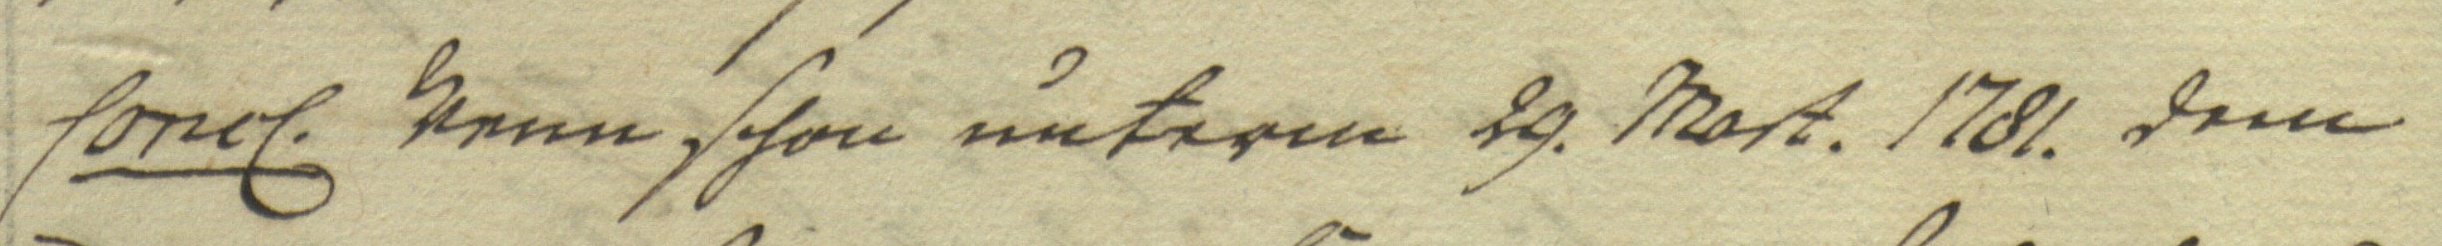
Concl. Wenn schon unterm 29. Mart. 1781. dem
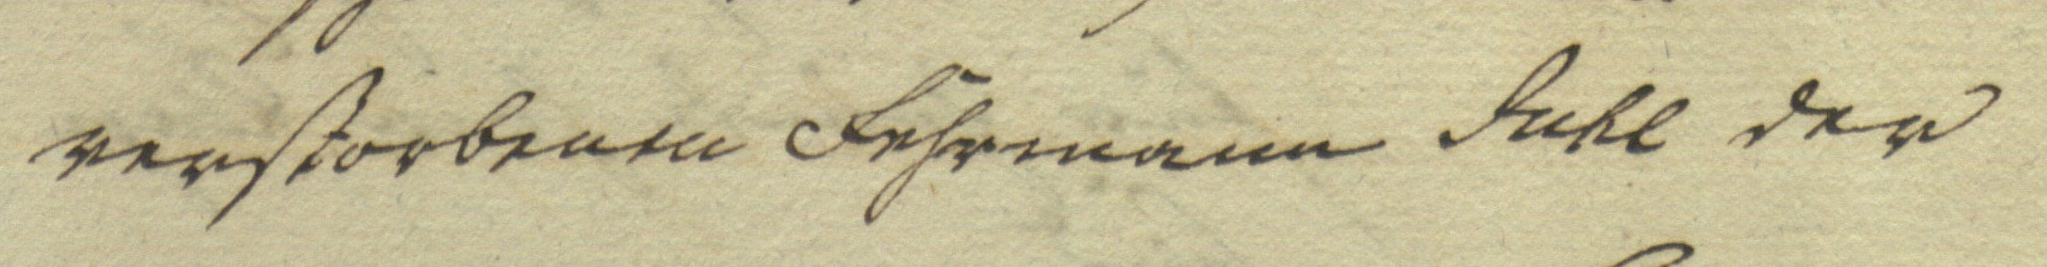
verstorbenen Fehrmann Juhl der
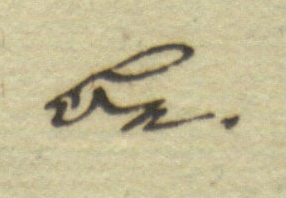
Be¬
